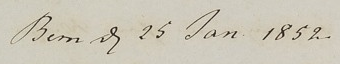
Bern den 25 Jan. 1852.
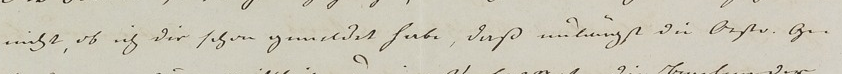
nicht, ob ich Dir schon gemeldet habe, daß unlängst die Oestr. Ge-
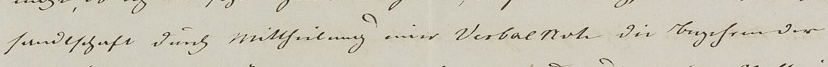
sandtschaft durch Mittheilung einer Verbal Note die Begehren der
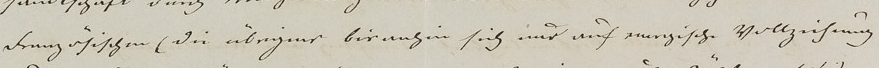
Französischen (die übrigens bisanhin sich nur auf energische Vollziehung
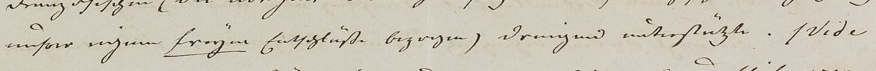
unsrer eignen freyen Entschlüße bezogen) dringend unterstützte. ( Vide
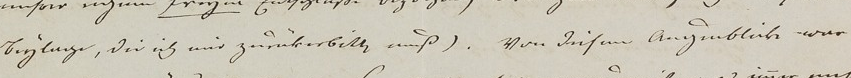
Beylage, die ich mir zurükerbitten muß). Von diesem Augenblicke war
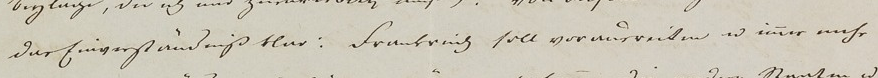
das Einverständniß klar: Frankreich soll vorausreiten u immer mehr
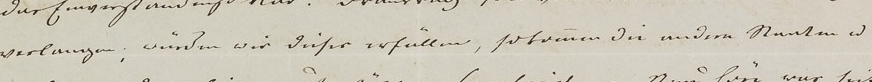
verlangen; würden wir dieses erfüllen, so kommen die andern Staaten u
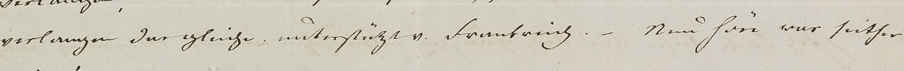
verlangen das gleiche, unterstützt v. Frankreich. – Nun höre was seither
